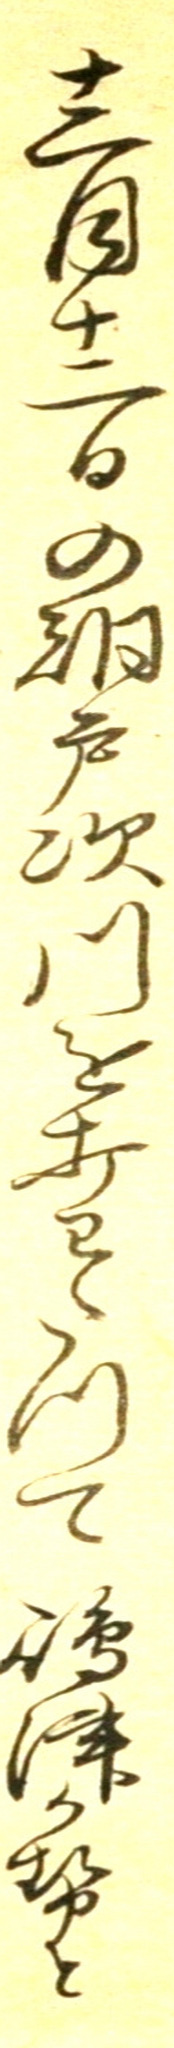十二月十二日の朝戸次川を打わたつて島津か勢と
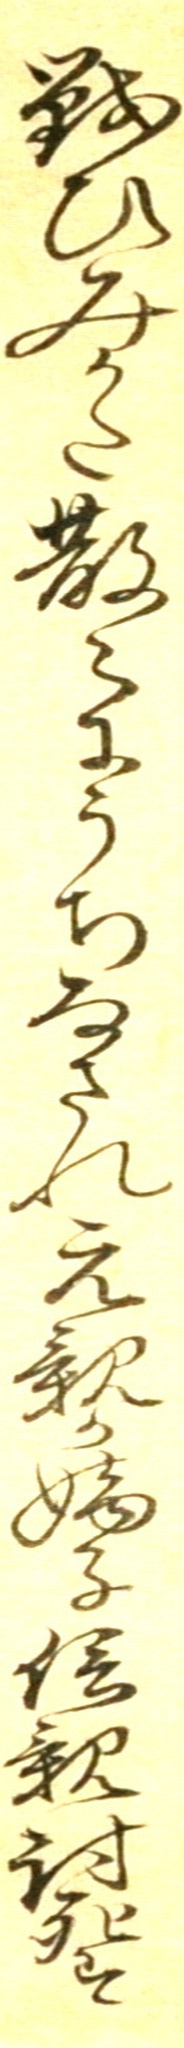戦ひみかた散々にうちなされ元親か嫡子信親討死す
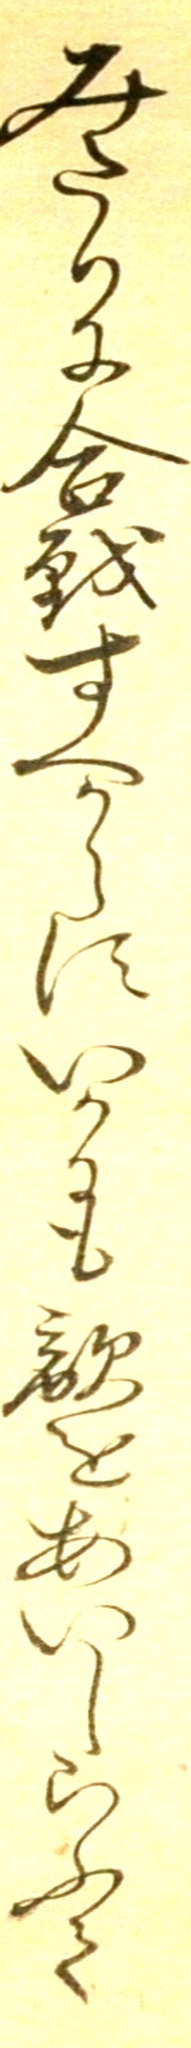みたりに合戦すへからすいかにも敵をあいしらふて
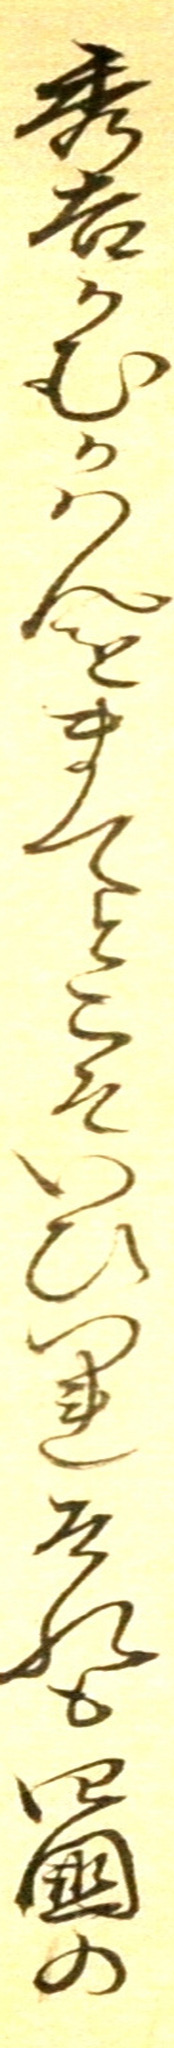秀吉かむかはんをまてとこそいひつれそれも四国の
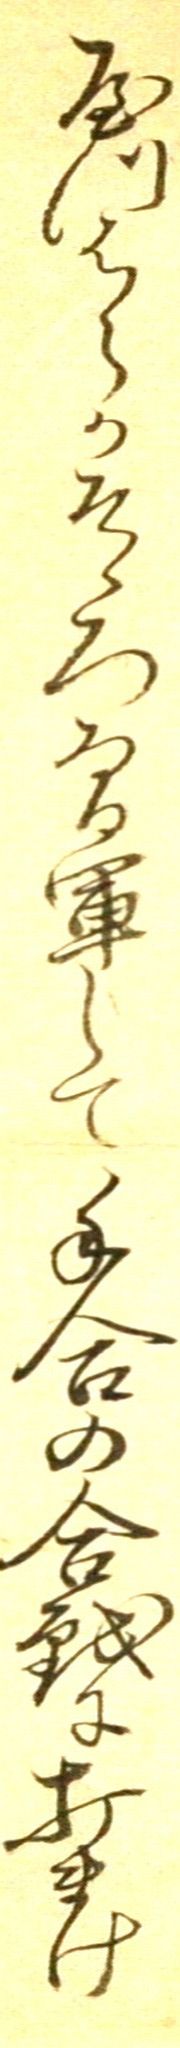やつはらかそゝろなる軍して手合の合戦に打まけ
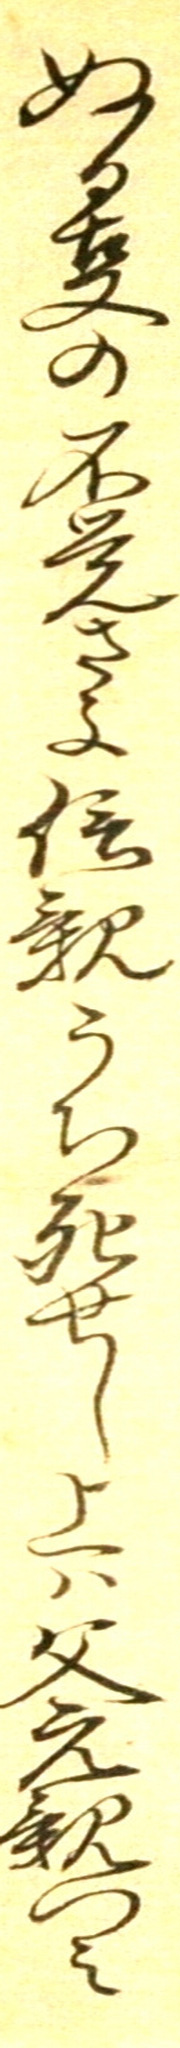ぬる事の不覚さよ信親うち死せし上は父元親つみ
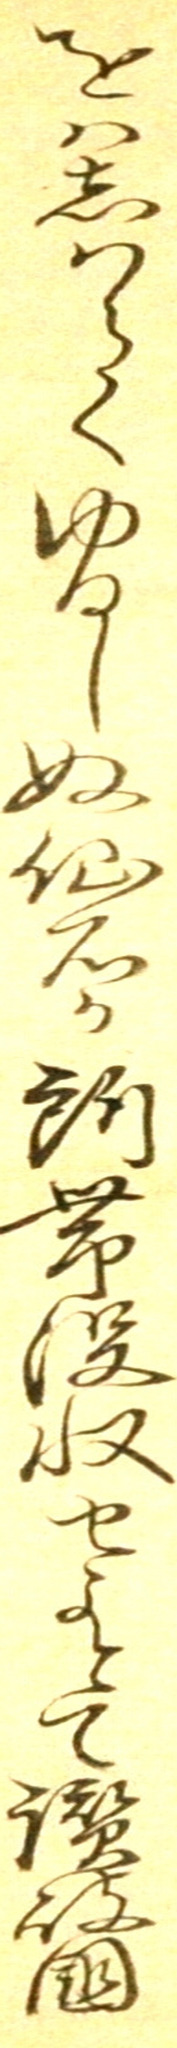をはしはらくゆるしぬ仙石か所帯没収せよとて讃岐国
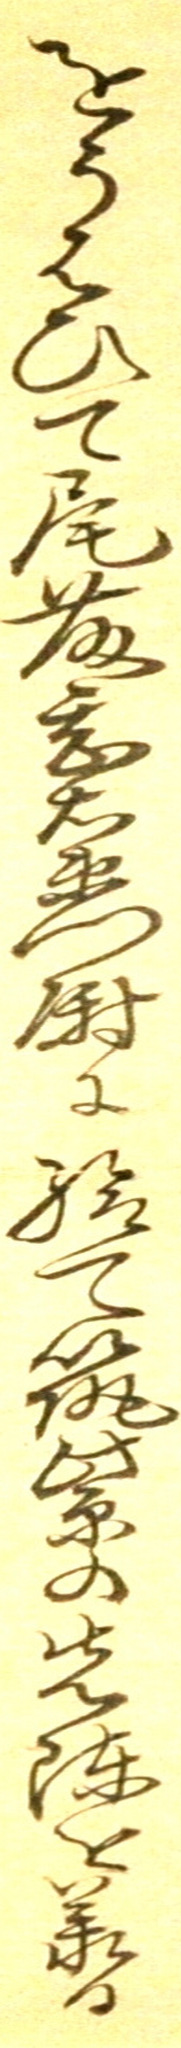をうはひて尾藤甚右衛門尉に給て筑紫の先陣を承る
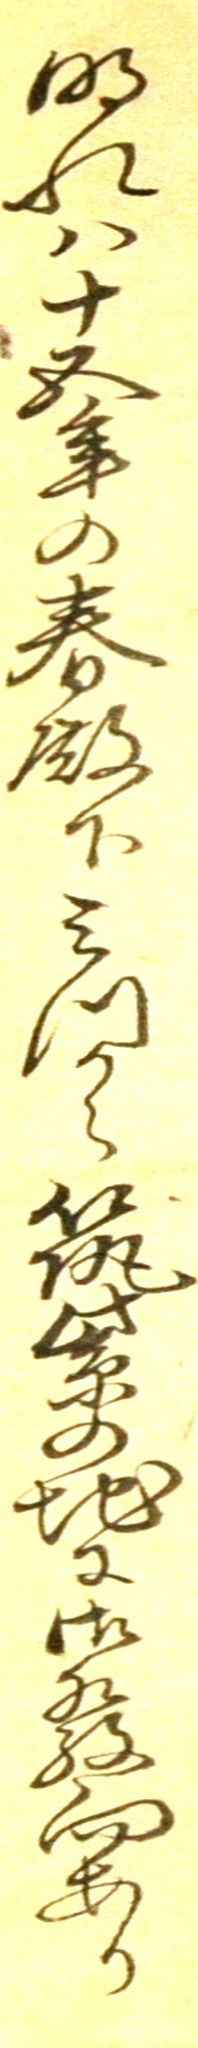明れは十五年の春殿下みつから筑紫の地に御発向あり

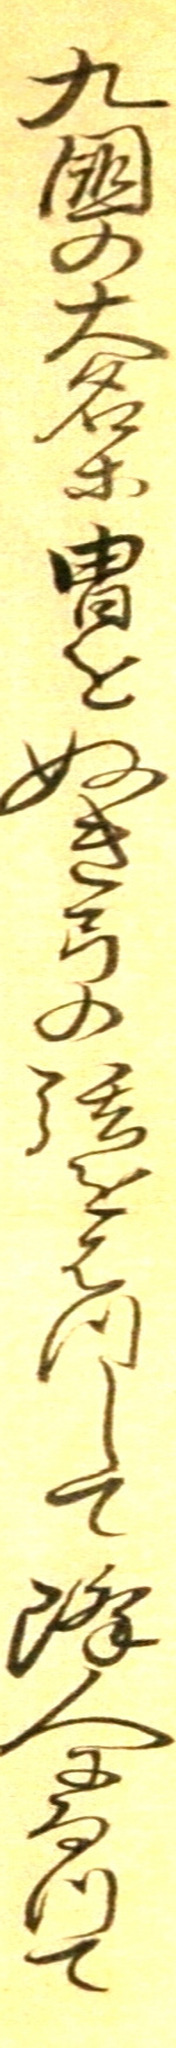九国の大名等冑をぬき弓の弦をはつして降人になつて
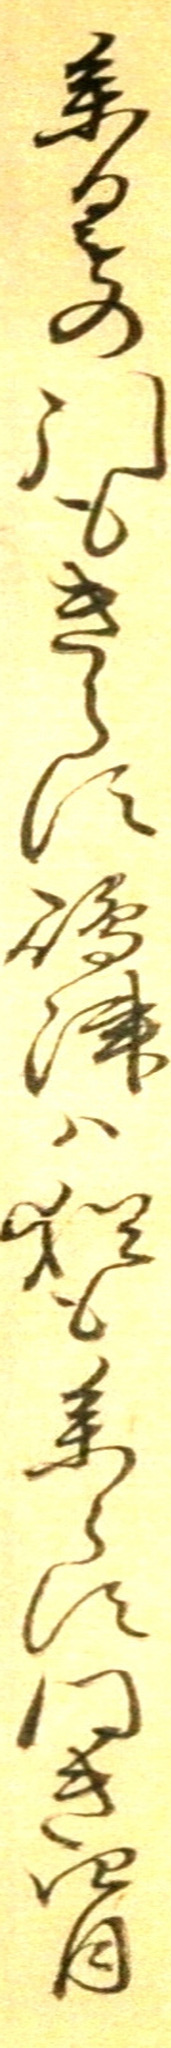参るもの引もきらす島津は猶も参らす同き四月
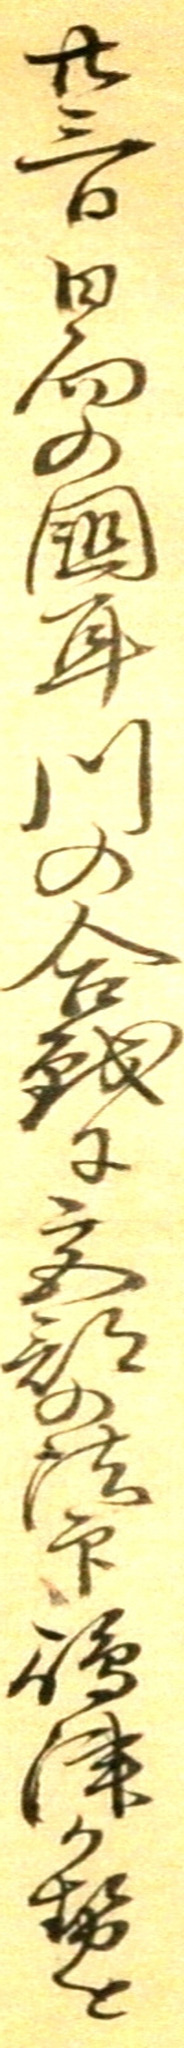廿三日日向の国耳川の合戦に宮部の法印島津か勢を
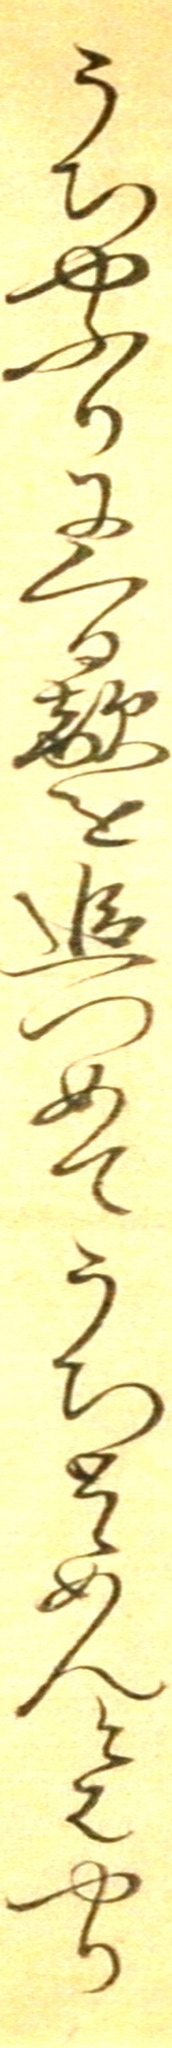うちやふりにくる敵を追つめてうちとゝめんとはやり
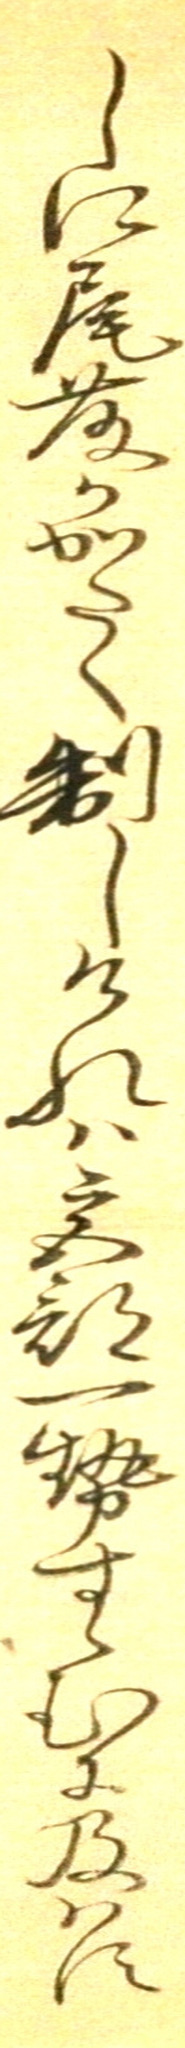しに尾藤かかたく制しけれは宮部一勢すゝむに及はす
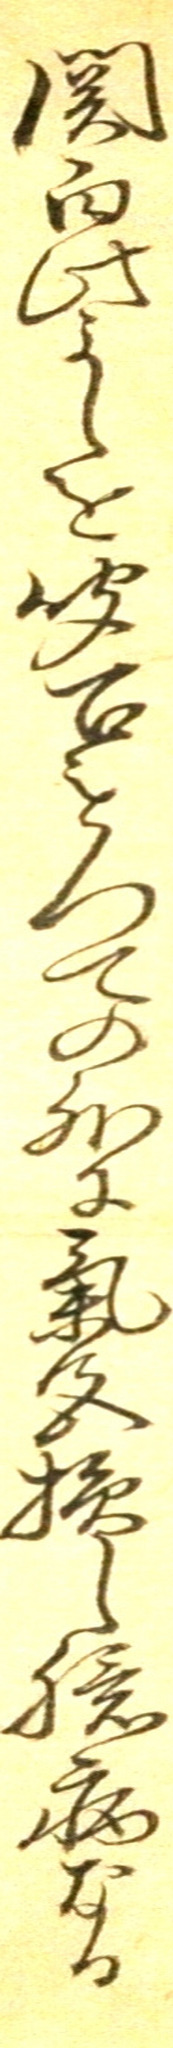関白此よしを聞召もつての外に気色損し臆病なる
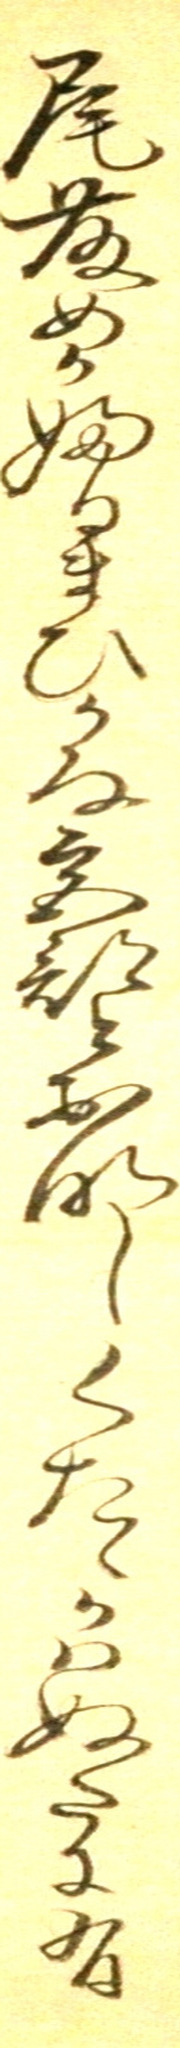尾藤めかふるまひかな宮部とおなしくたゝかはぬたに有
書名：藩翰譜（九・上）
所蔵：伊那市立高遠町図書館・合同会社AMANE
